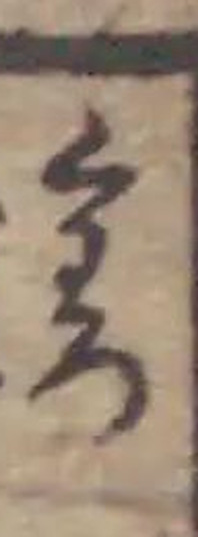くわつ
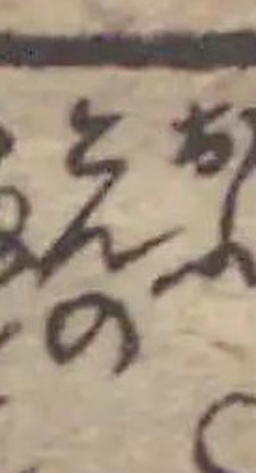こんの
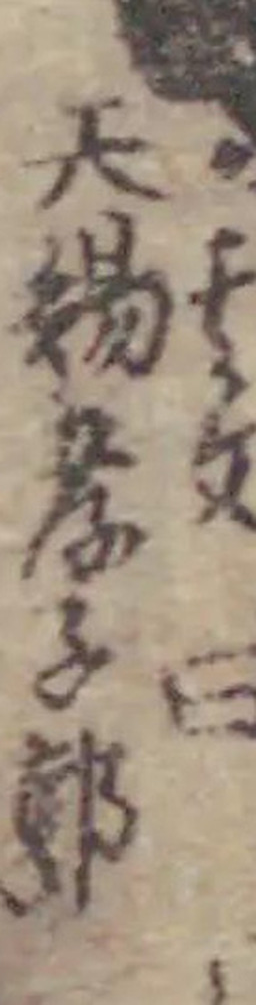天賜孝子郭
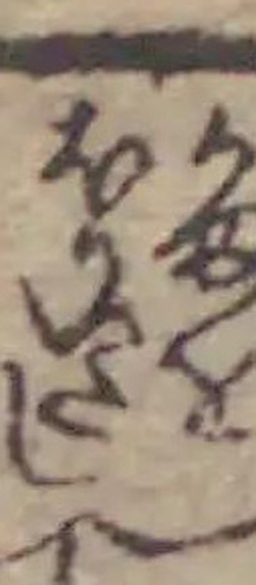ほりいたし
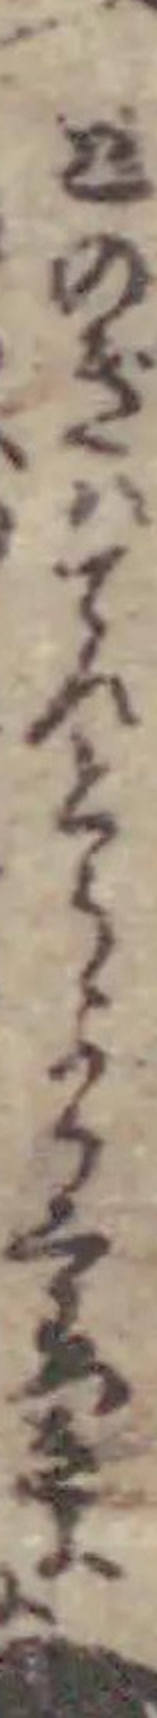このぎはてんとうよりくわつきよに
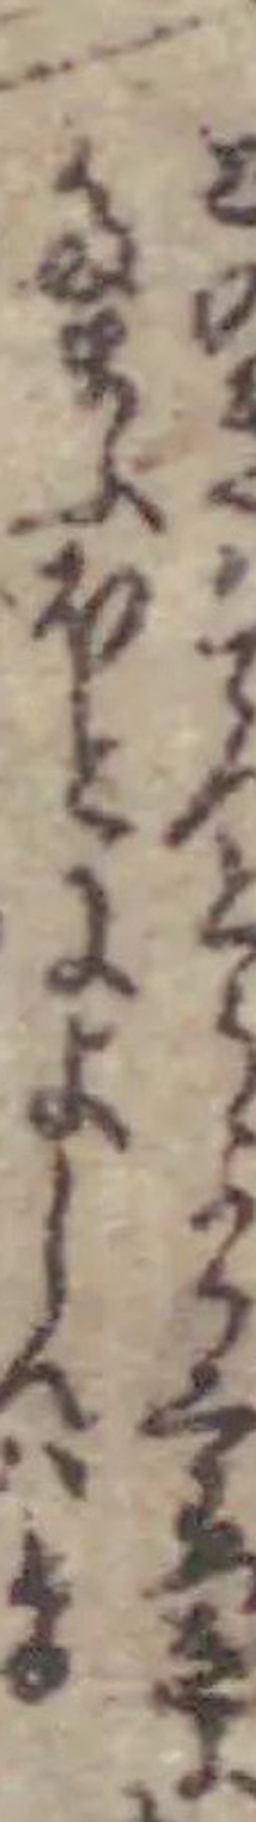たまふほとによしんはとる
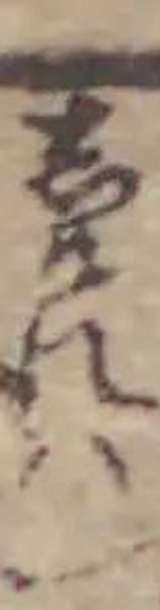しけれは
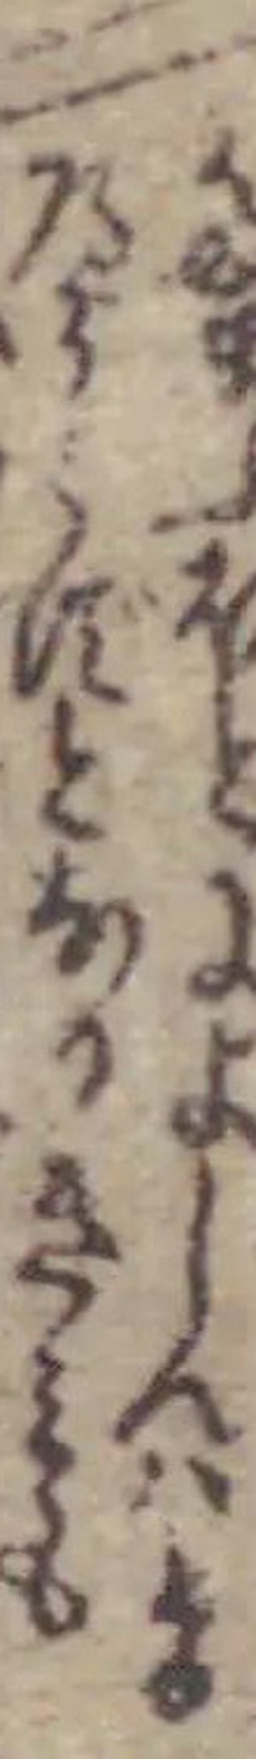へからずとなりきみも
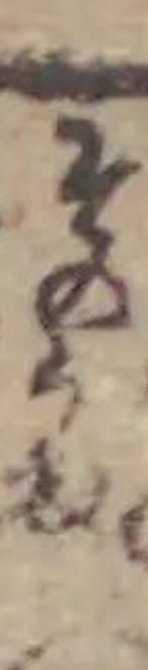そのかま
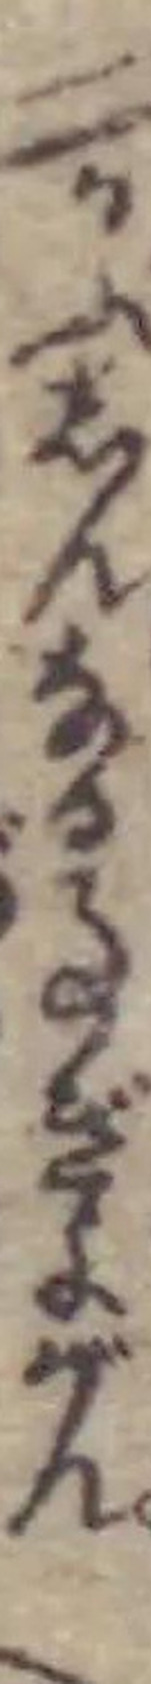かふしんなる事ぎよがん
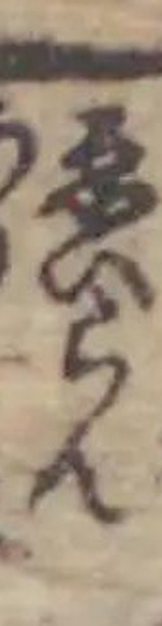ゑいらん
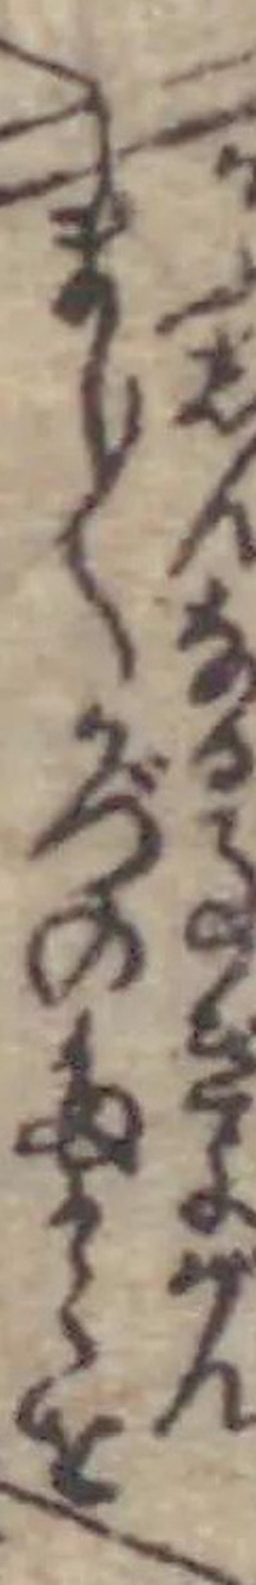まし〳〵かづのたからを
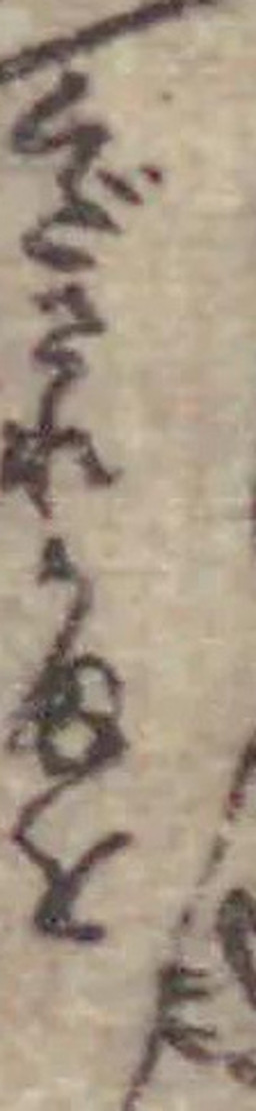くだされかまを
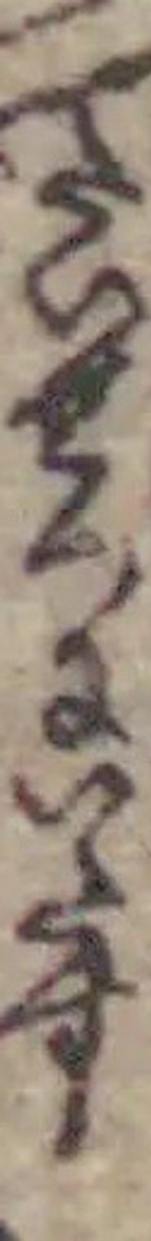たいせつにいたす
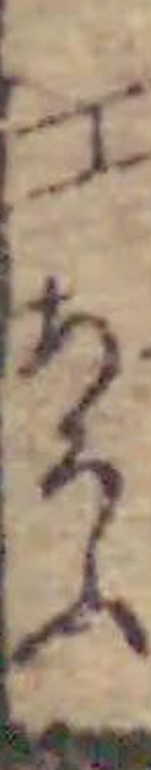あろふ

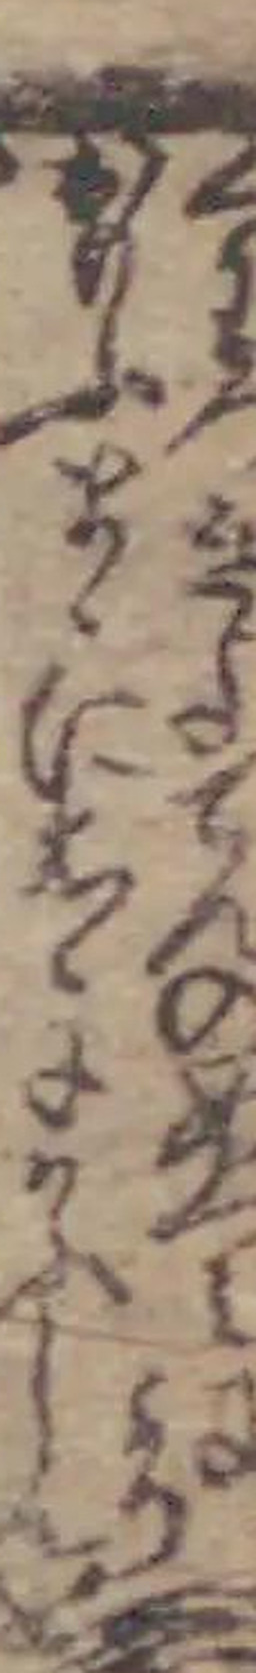おもふまゝにはゝにかふしんを
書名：間違月夜鍋 2巻
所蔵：国立国会図書館 National Diet Library, JAPAN
